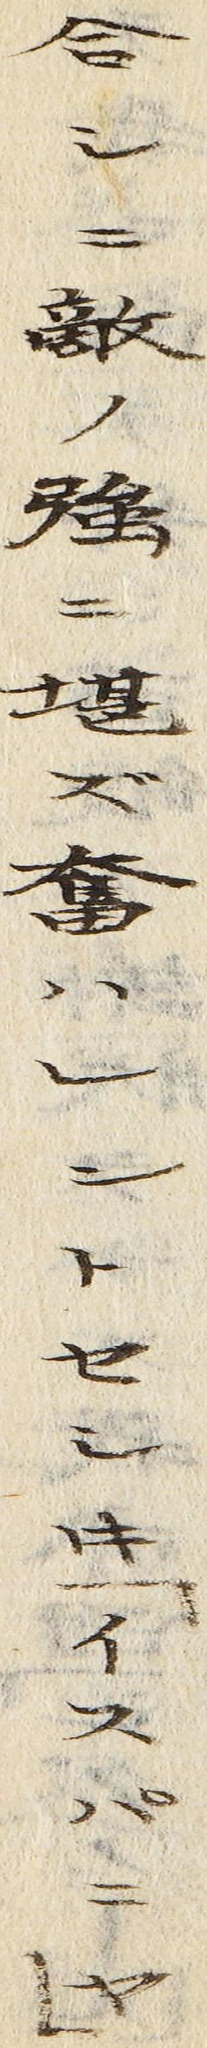合シニ敵ノ強ニ堪ズ奮ハレントセシトキ「イスパニヤ」
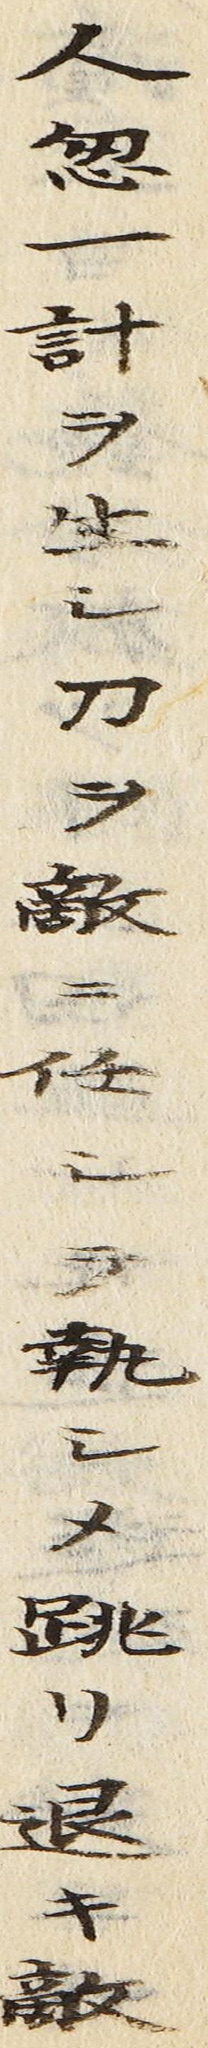人忽一計ヲ生シ刀ヲ敵ニ任シテ執シメ跳リ退キ敵
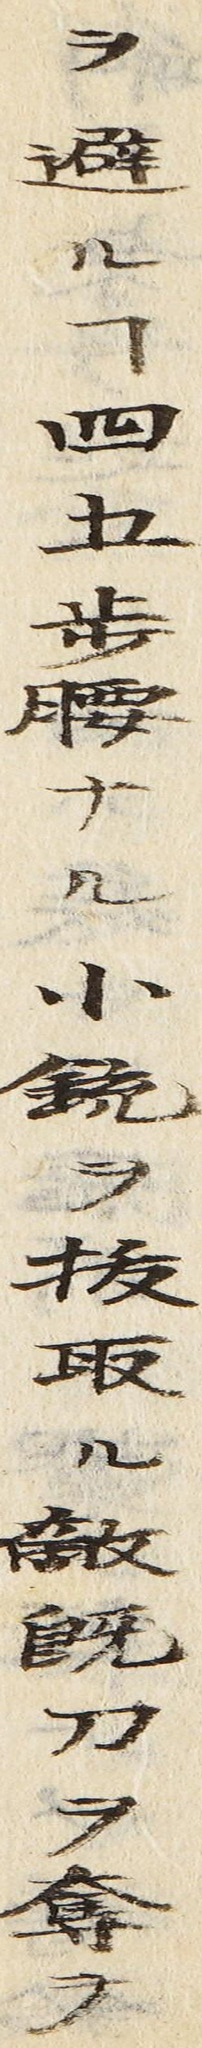ヲ避ルコト四五歩腰ナル小銃ヲ抜取ル敵既刀ヲ奪テ
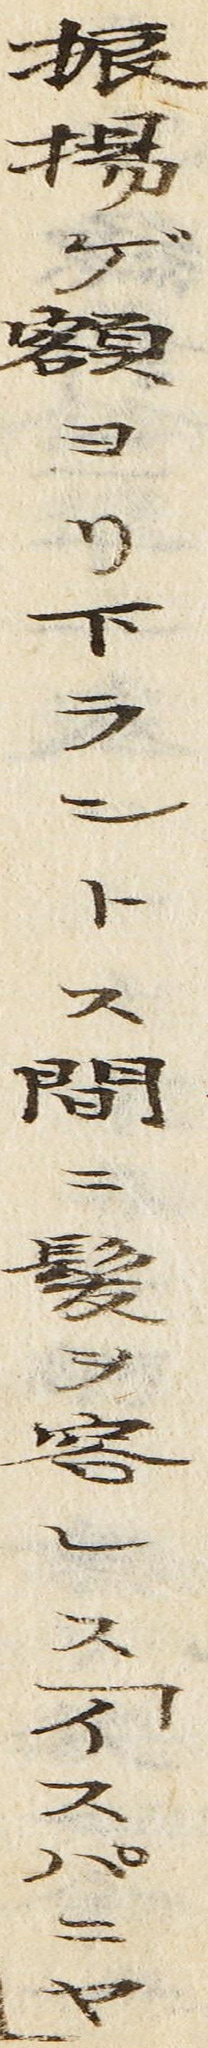振揚ゲ額ヨリ下ラントス間ニ髪ヲ容レス「イスパニヤ」
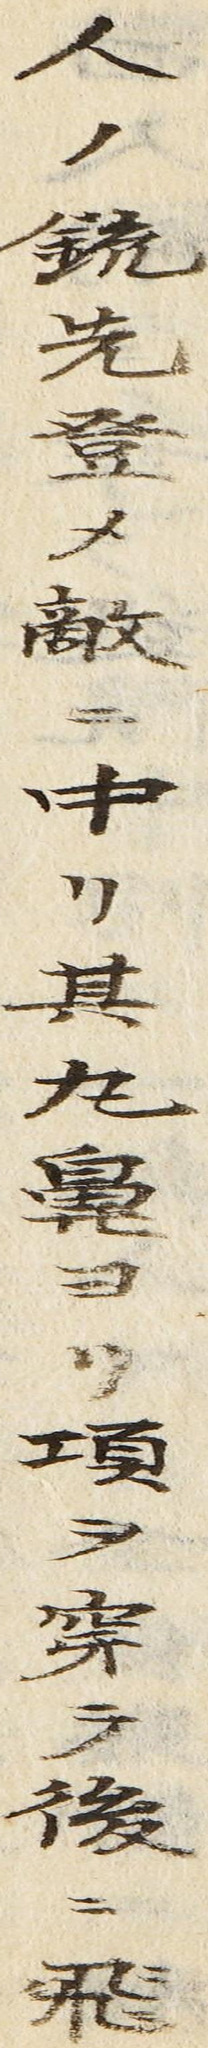人ノ銃先登シテ敵ニ中リ其丸鼻ヨリ項ヲ穿テ後ニ飛
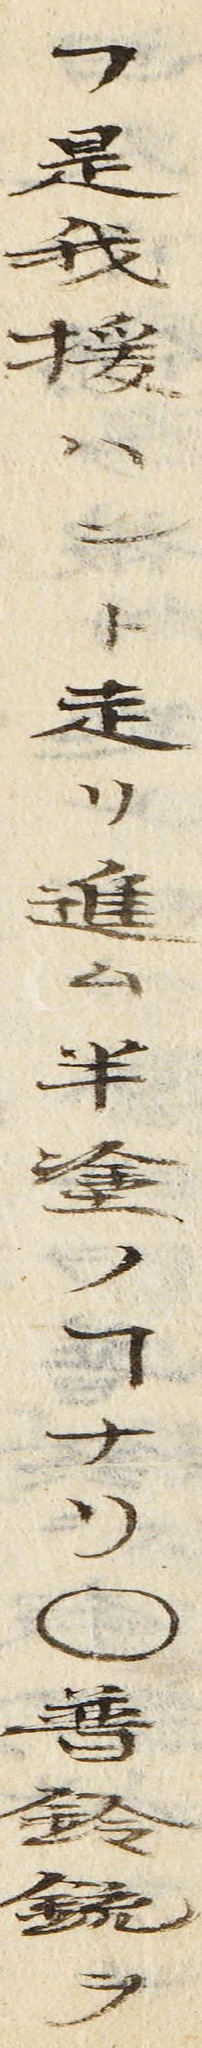フ是我援ハント走リ進ム半塗ノコトナリ◯普鈴銃ヲ
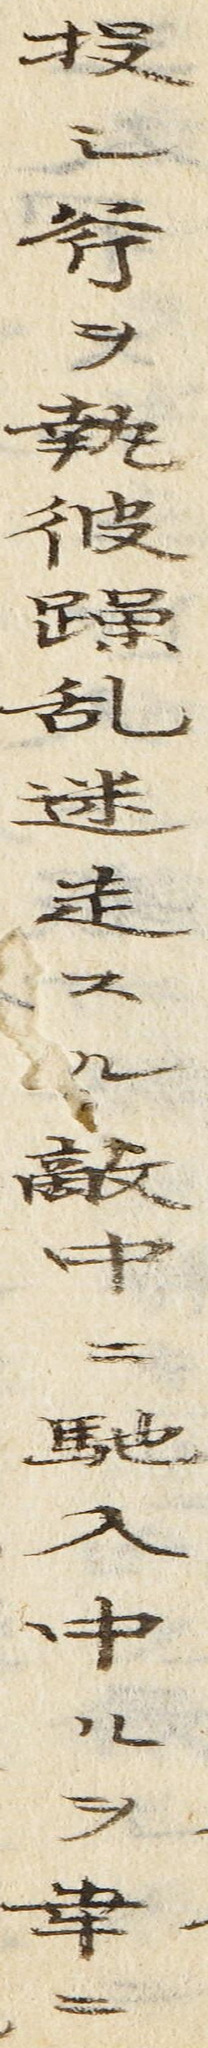投シ斧ヲ執彼躁乱迷走スル敵中ニ馳入中ルヲ幸ニ
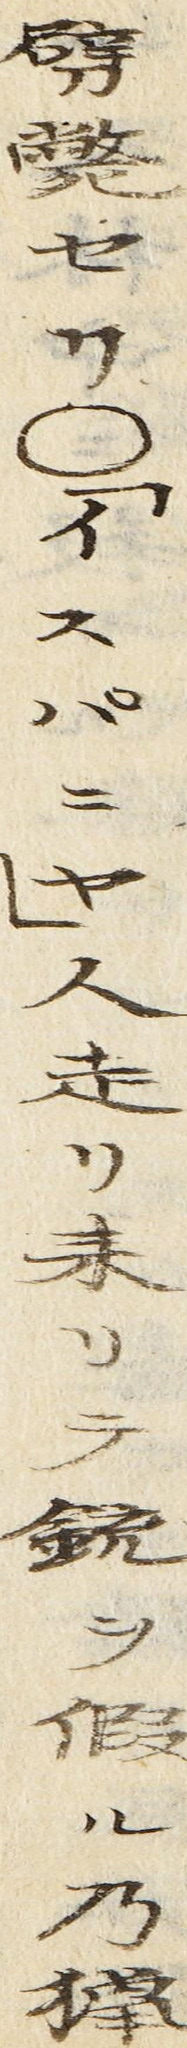劈斃セリ◯「イスパニヤ」人走リ来リテ銃ヲ仮ル乃猟
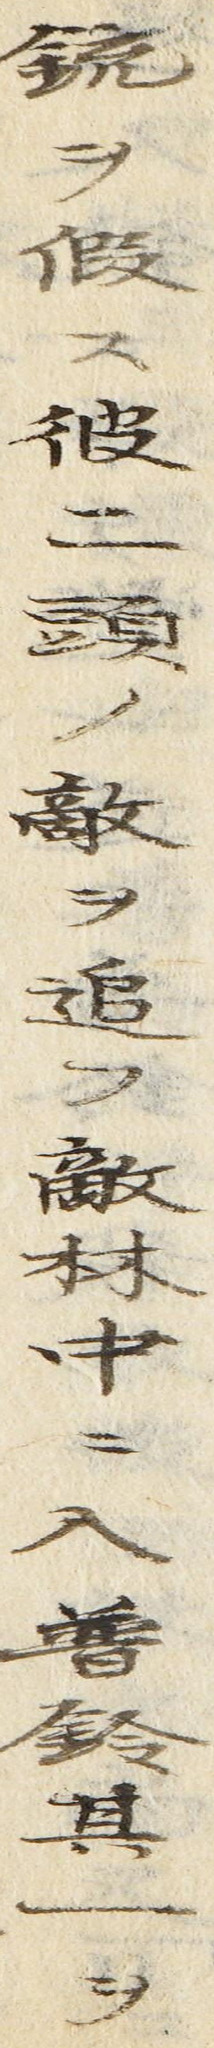銃ヲ仮ス彼二頭ノ敵ヲ追フ敵林中ニ入普鈴其一ヲ
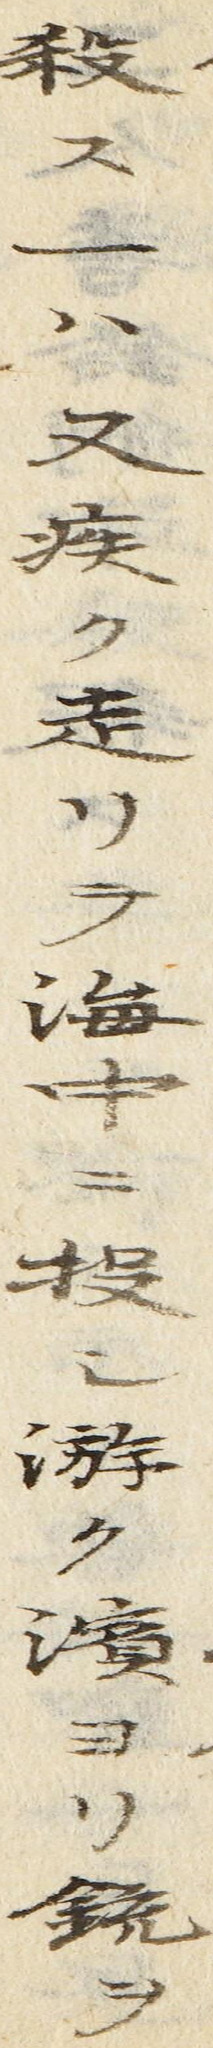殺ス一ハ又疾ク走リテ海中ニ投シ游ク浜ヨリ銃ヲ
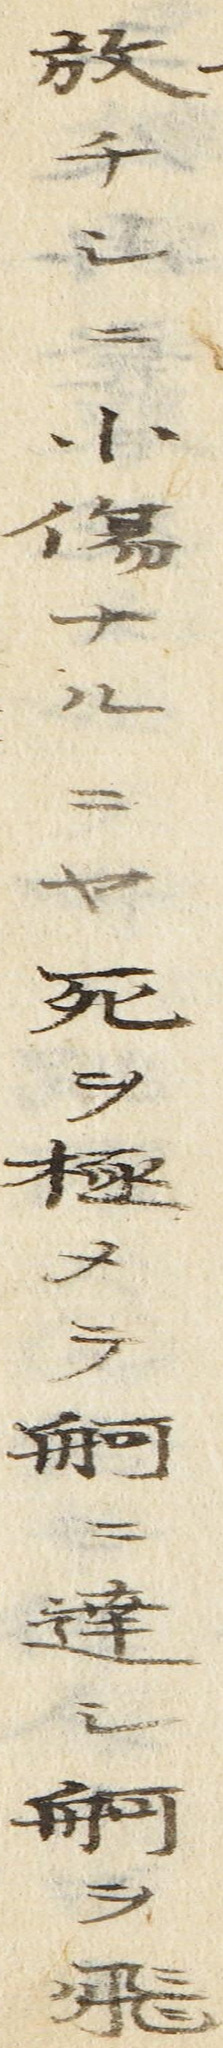放チシニ小傷ナルニヤ死ヲ極メテ舸ニ達シ舸ヲ飛
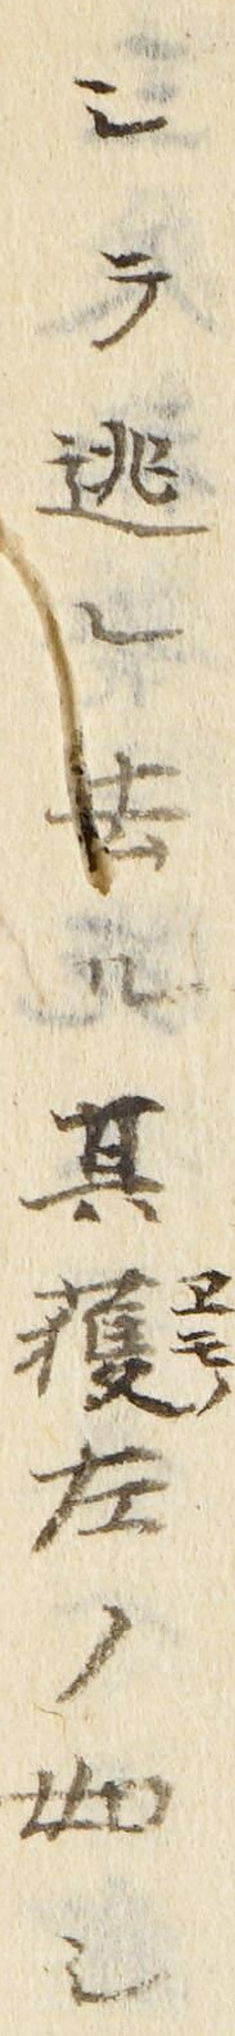シテ逃レ去ル其獲左ノ如シ

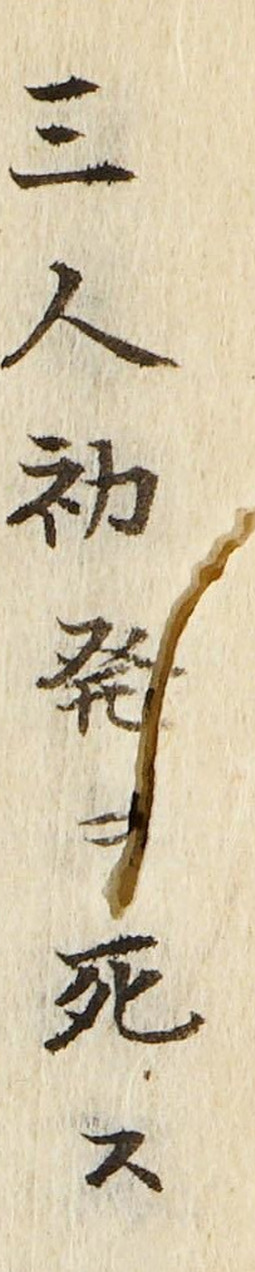三人初発ニ死ス
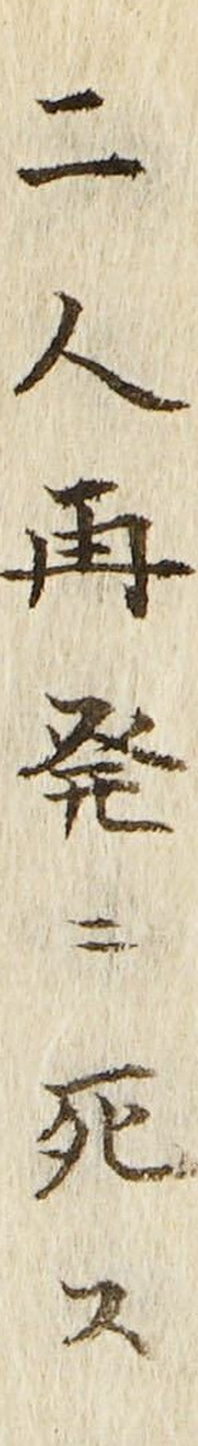二人再発ニ死ス
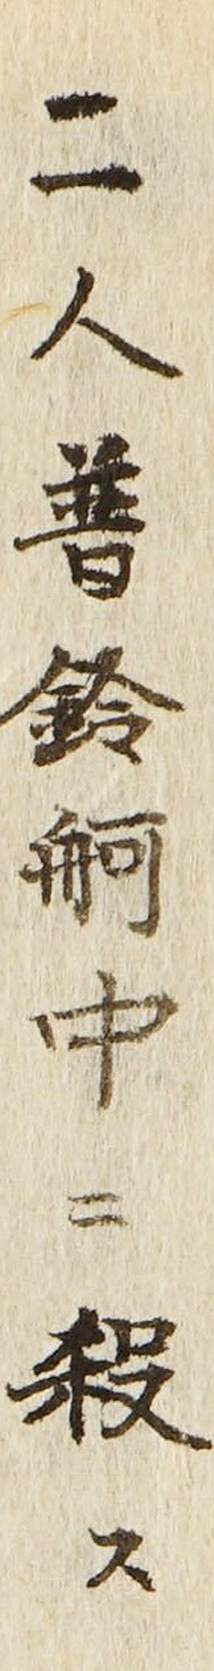二人普鈴舸中ニ殺ス
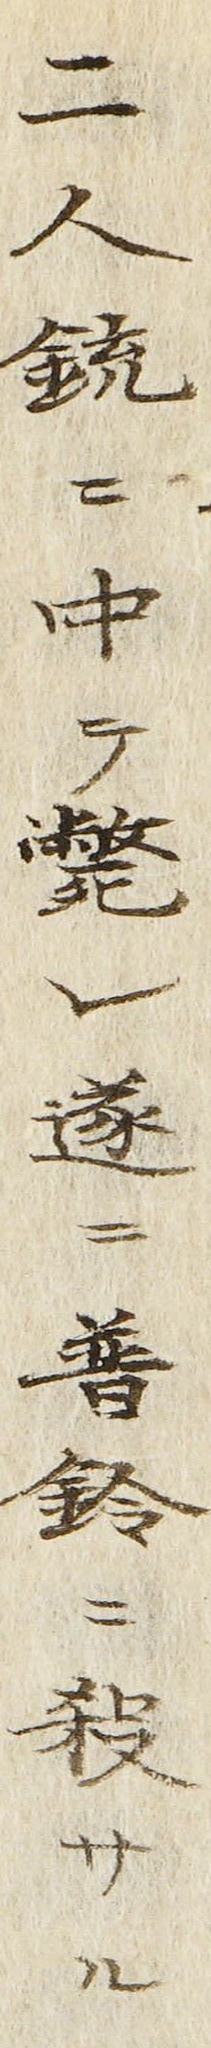二人銃ニ中テ斃レ遂ニ普鈴ニ殺サル
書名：漂流紀事
